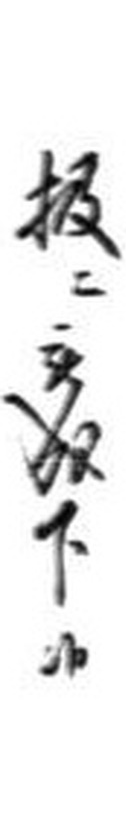扱ニ被成下候
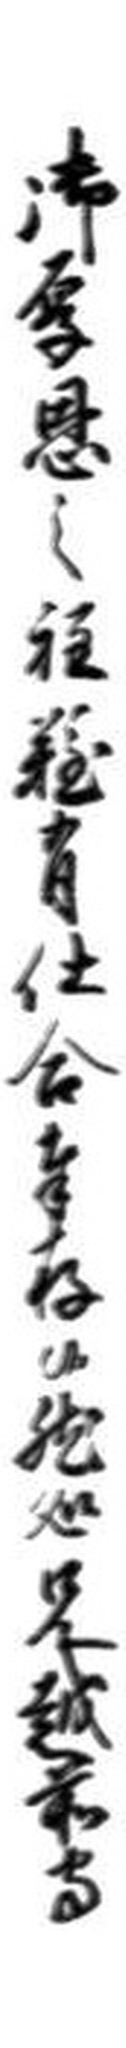御厚恩之程難有仕合奉存候然処兄越前守
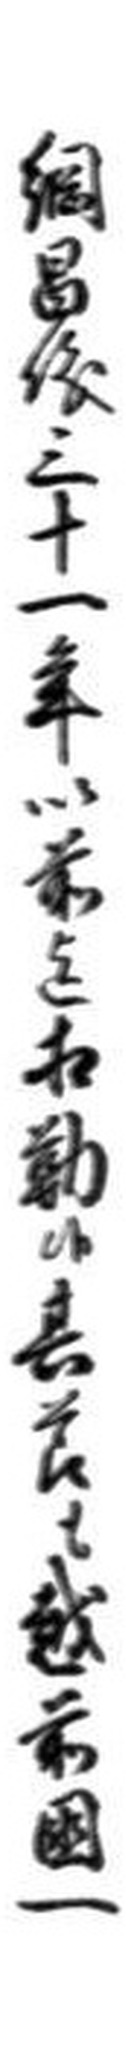綱昌儀三十一年以前迄相勤候其節も越前国一
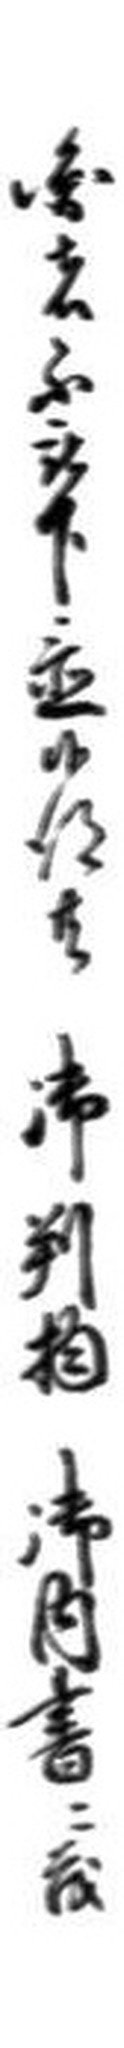円者不被下置候得共御判物御内書ニも
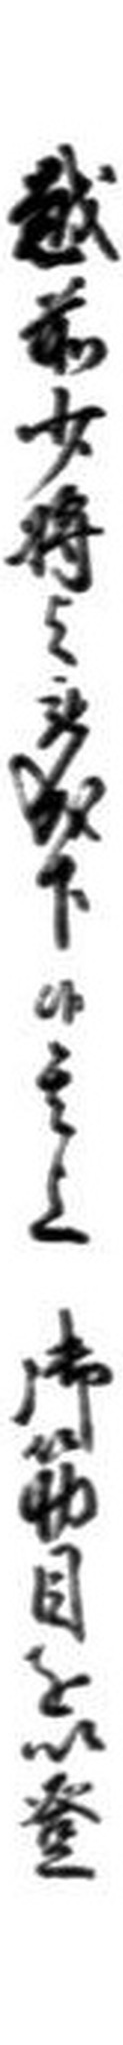越前少将と披成下候其上御筋目を以登
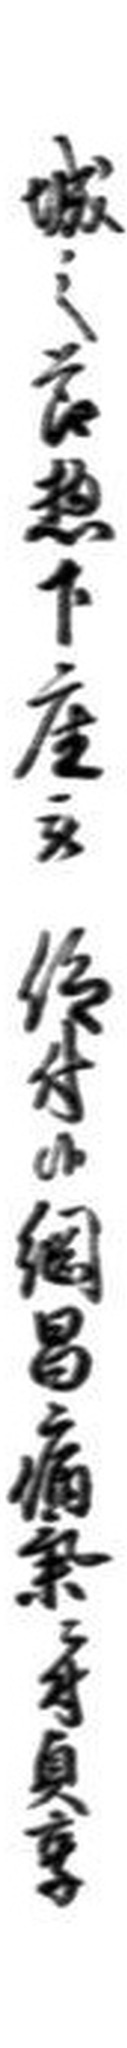城之節惣下座被仰付候綱昌病気ニ付貞享
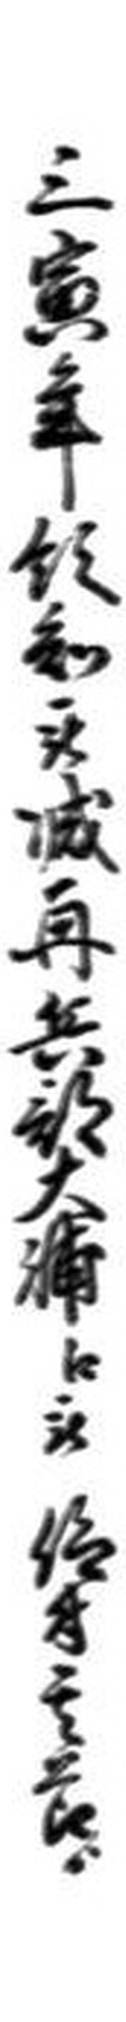三寅年領知被減再兵部大輔江被仰付其節ゟ
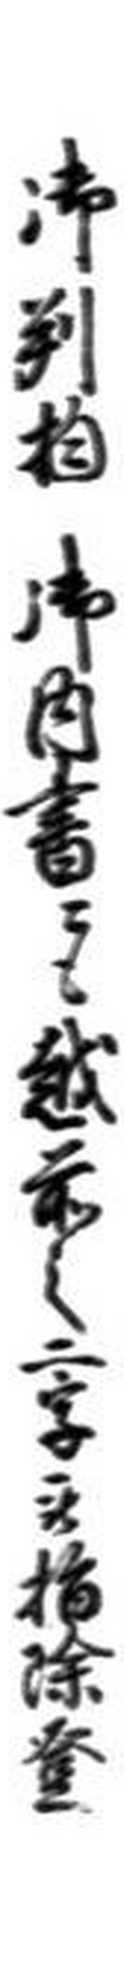御判物御内書ニも越前之二字被指除登
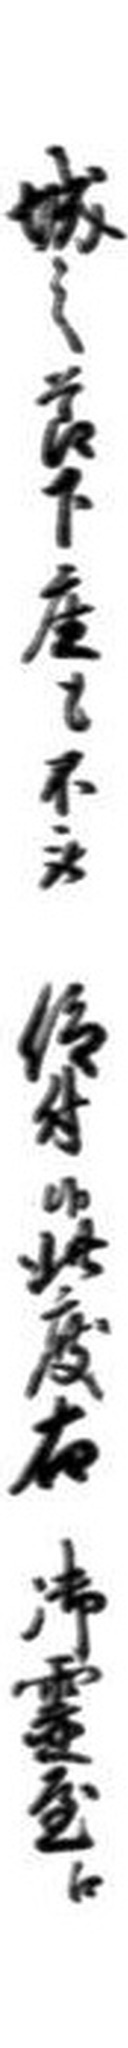城之節下座も不被仰付候此度右御霊屋江

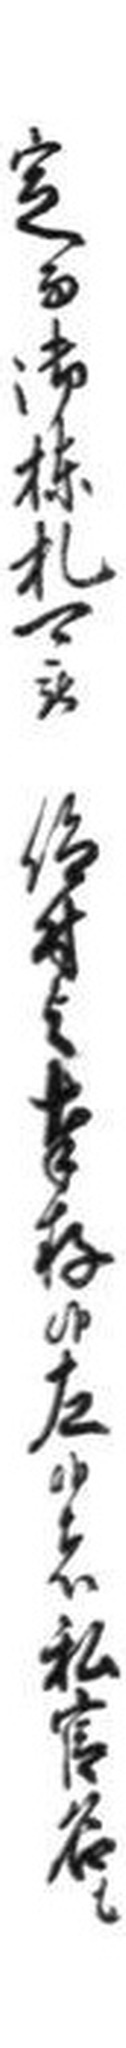定而御棟札可被仰付と奉存候左候者私官名も
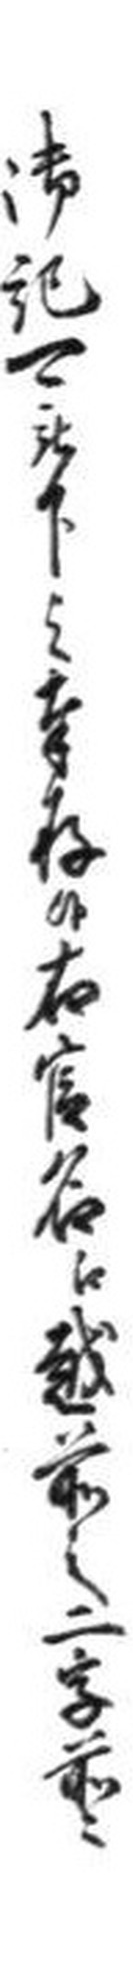御記可被下と奉存候候右官名江越前之二字前々
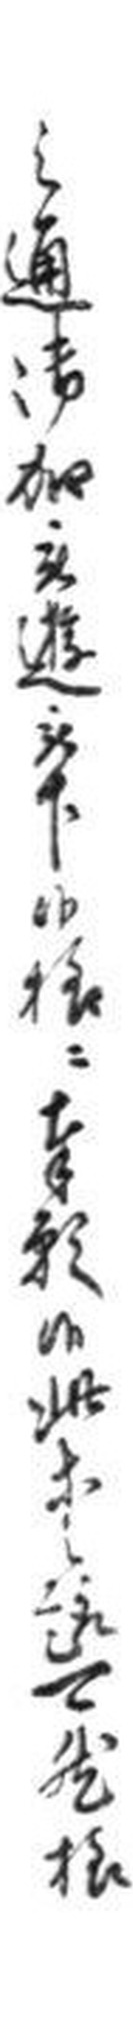之通御加被遊被下候様ニ奉願候此等之趣可然様
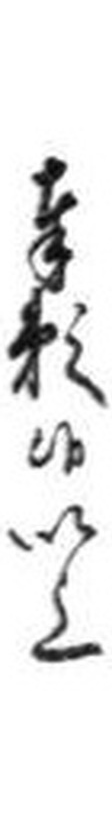奉願候以上
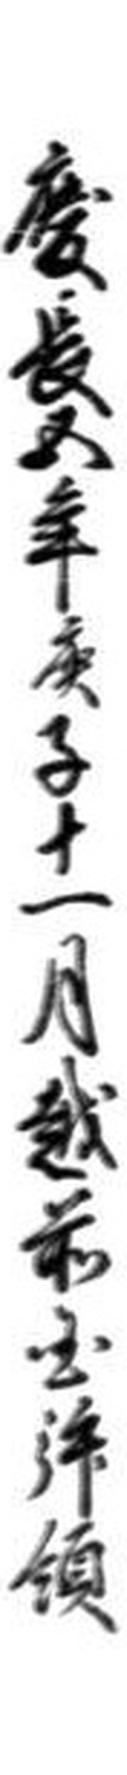慶長五年庚子十一月越前国拝領
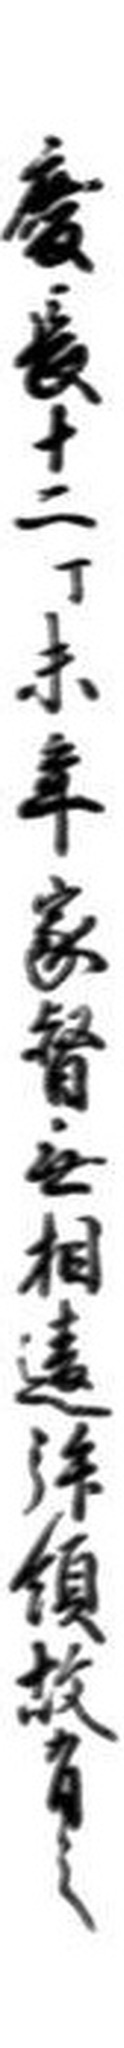慶長十二年丁未年家督無相違拝領故有之
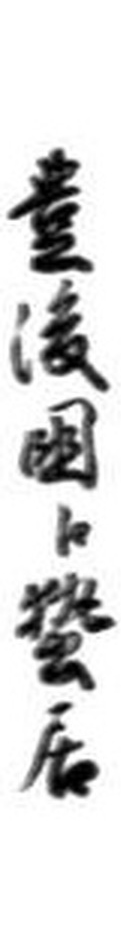豊後国江蟄居
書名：家譜 三十一 吉邦公 享保元年
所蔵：福井県文書館 Fukui Prefectural Archives
